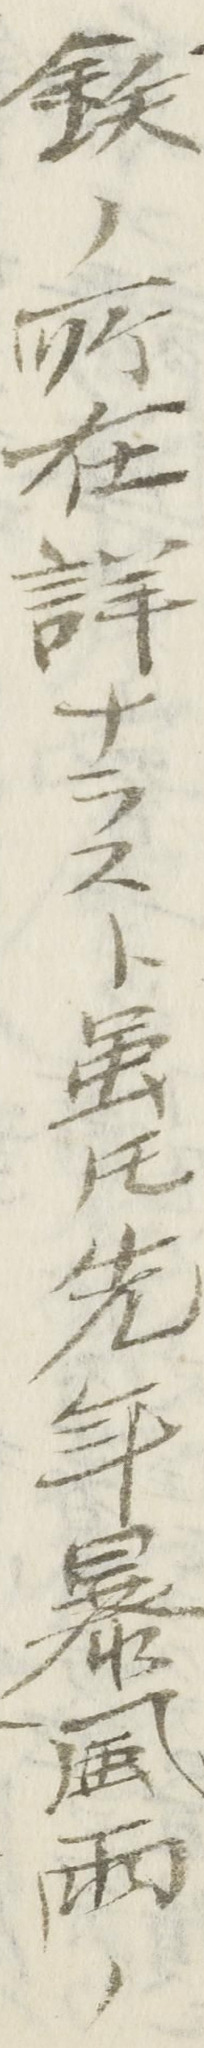鉄ノ所在詳ナラスト雖モ先年暴風雨ノ
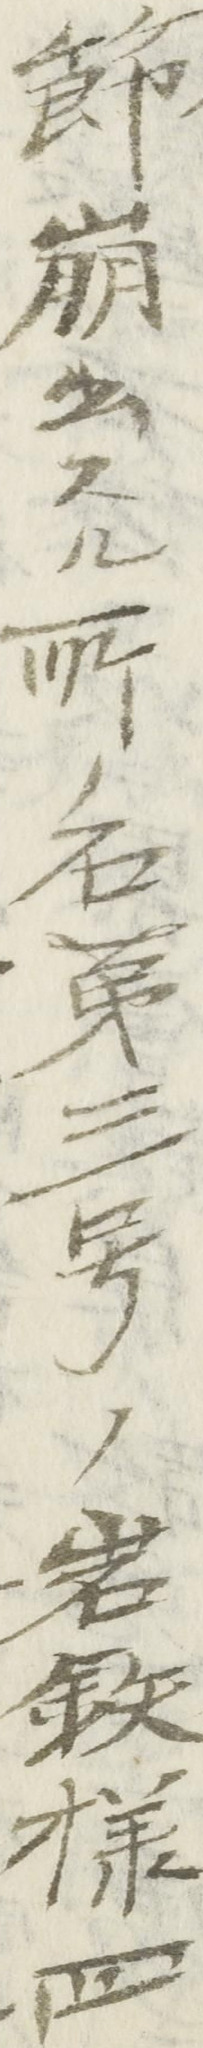節崩出スル所ノ石第三号ノ岩鉄様四
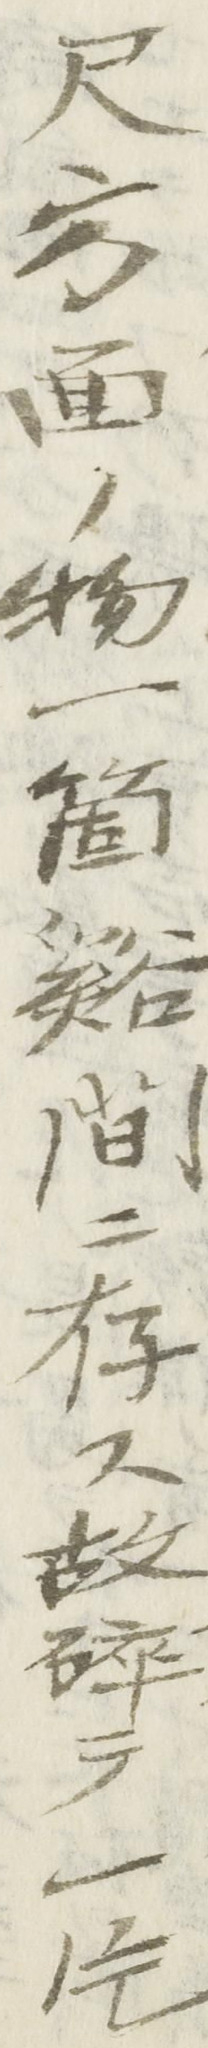尺方面ノ物一箇谿間に存ス故砕テ一片
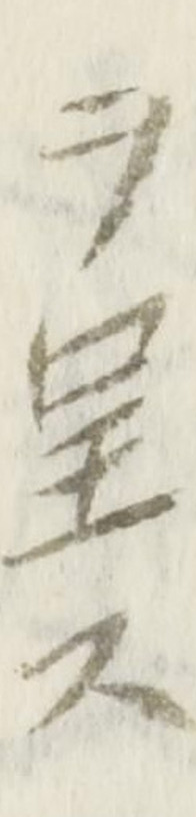ヲ呈ス
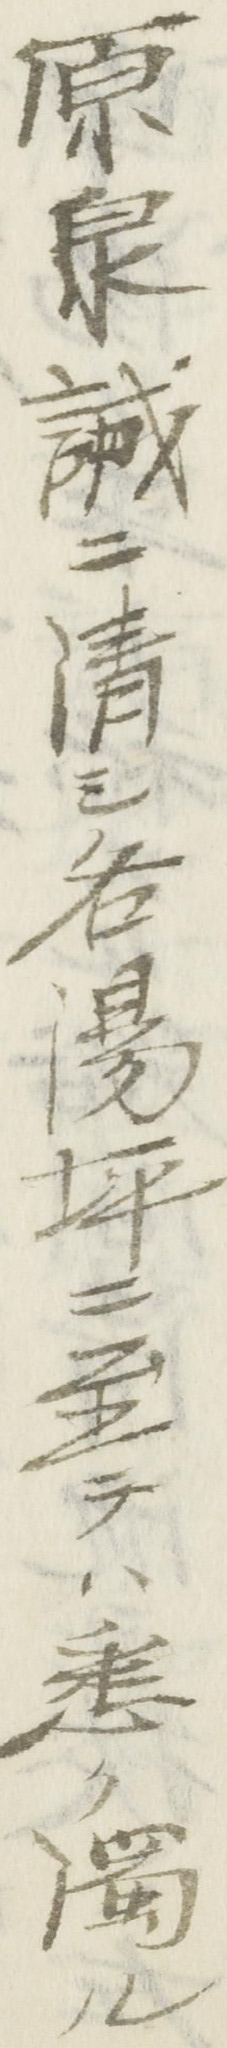原泉誠ニ清シ各湯坪二至テハ悉ク濁ル
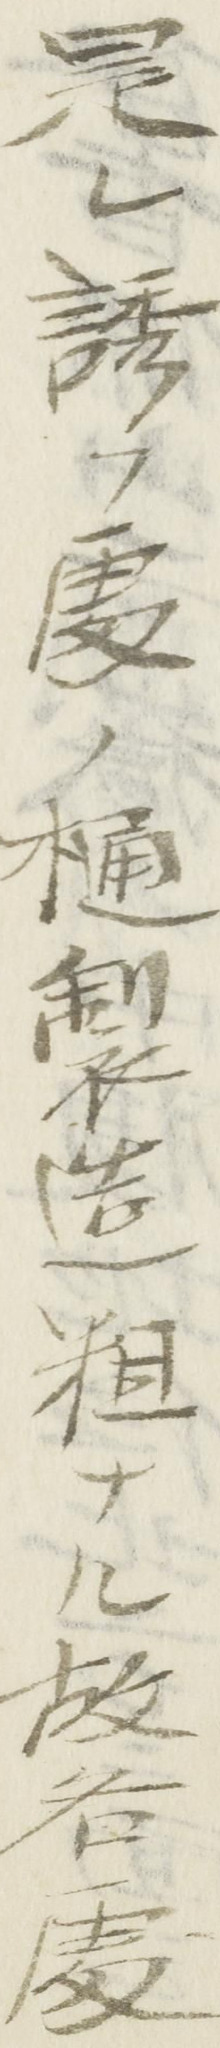是レ誘フ処ノ樋製造粗ナル故各処
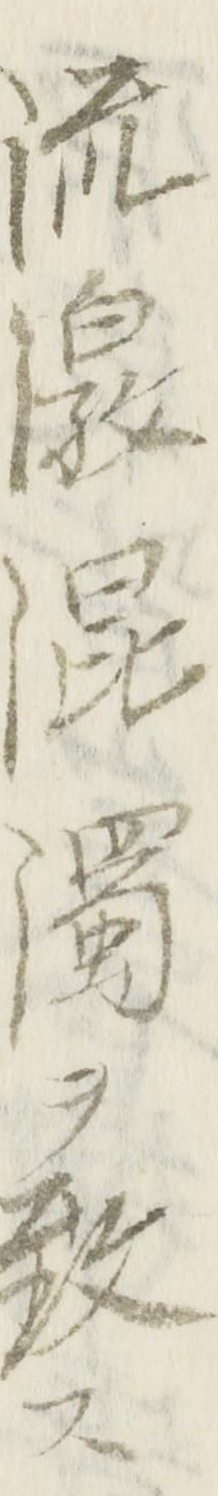流激混濁ヲ致ス
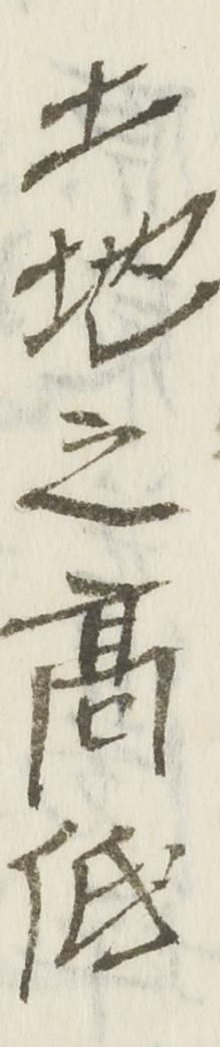土地ノ高低
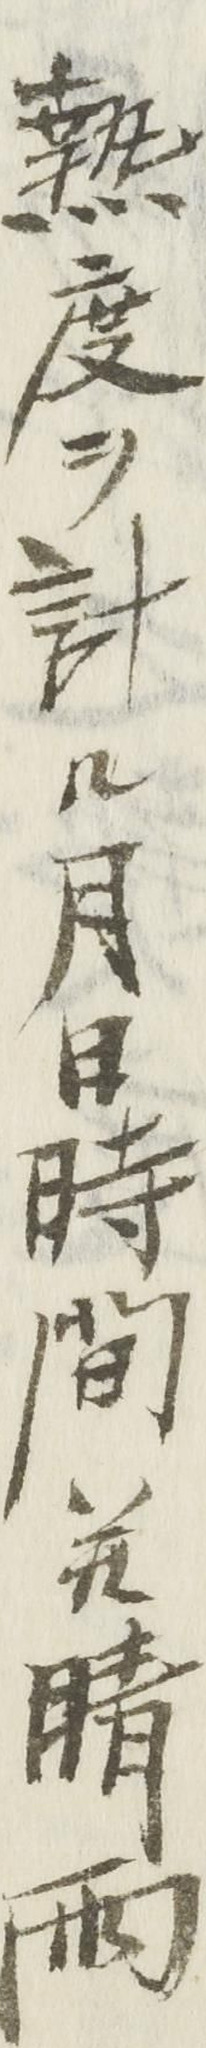熱度ヲ計ル月日時間並晴雨
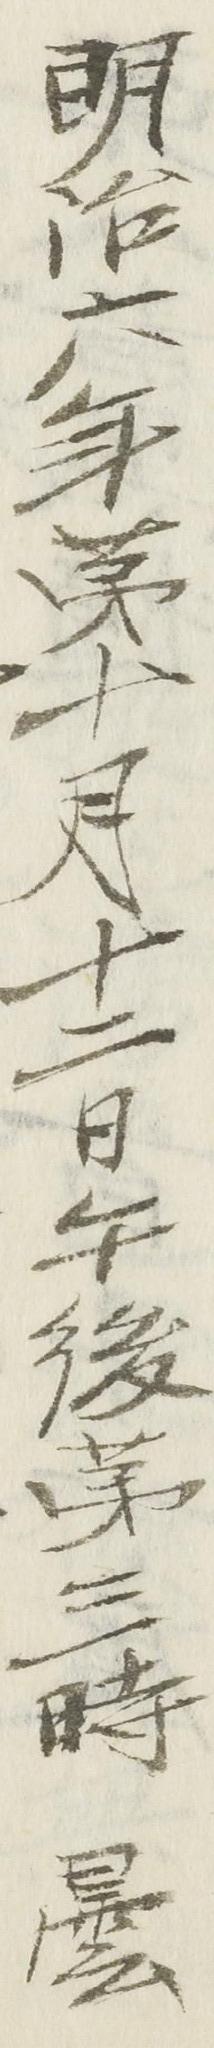明治六年第十月十二日午後第三時曇
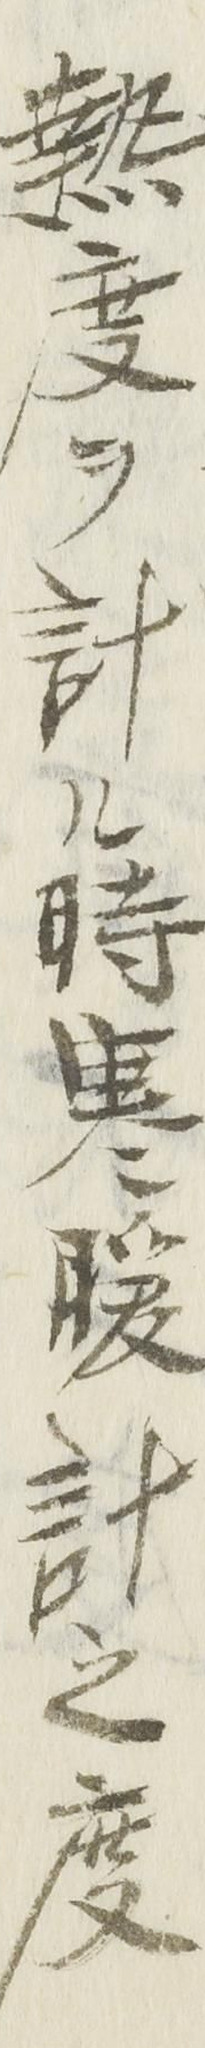熱度ヲ計ル時寒暖計ノ度
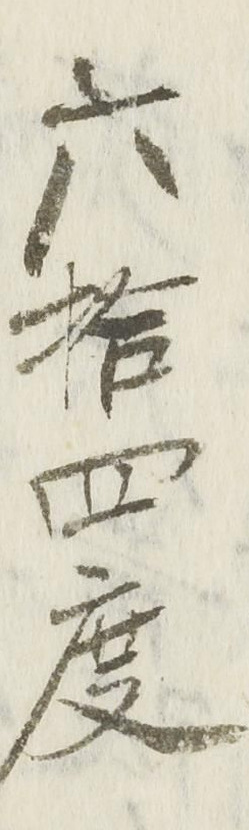六拾四度
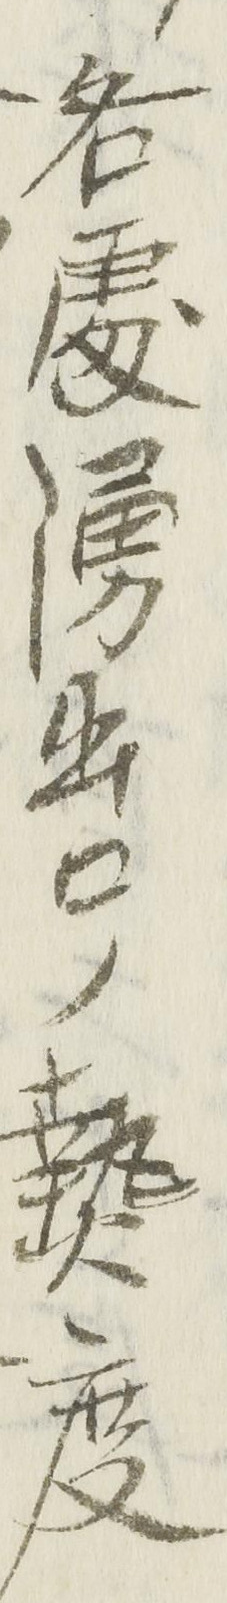各処湧出ノ熱度
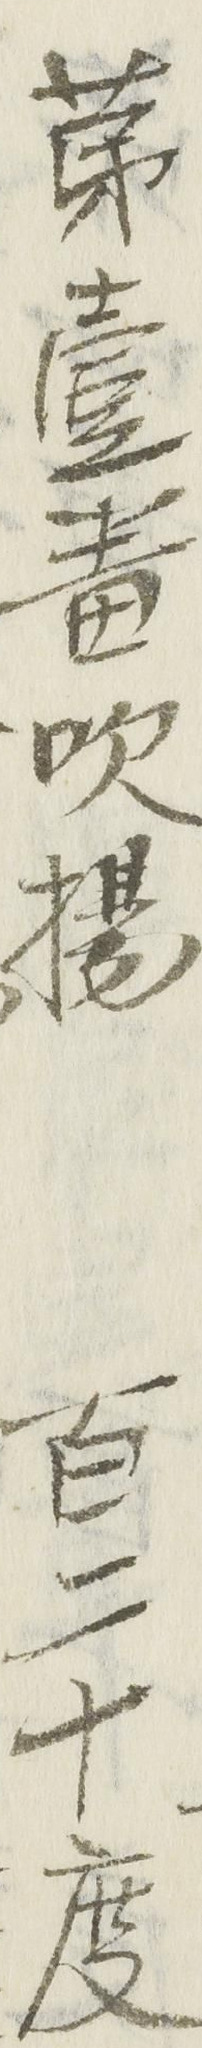第壱番吹揚百二十度

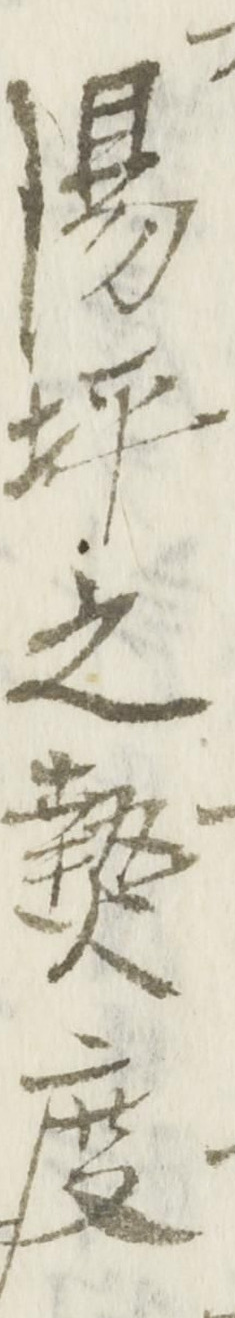湯坪之熱度
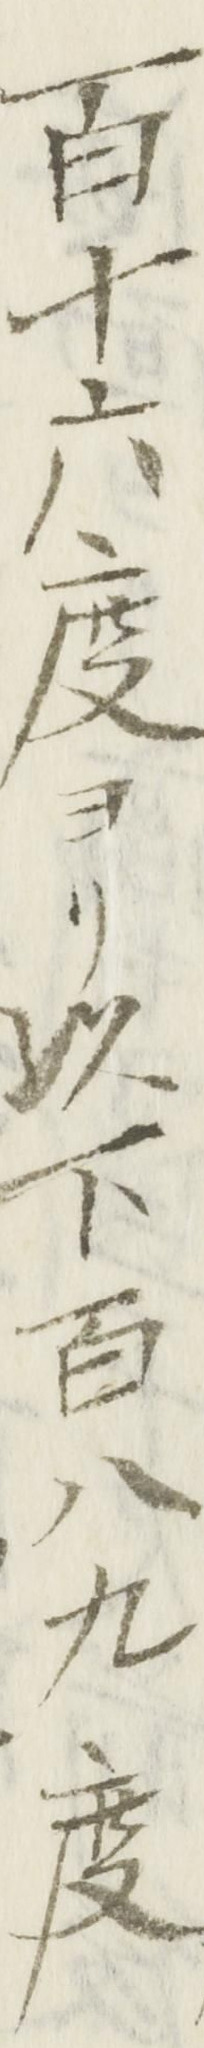百十六度ヨリ以下百八九度
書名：温冷泉試験表
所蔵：東京大学地震研究所図書室 Earthquake Research Institute Library, The University of Tokyo, JAPAN
